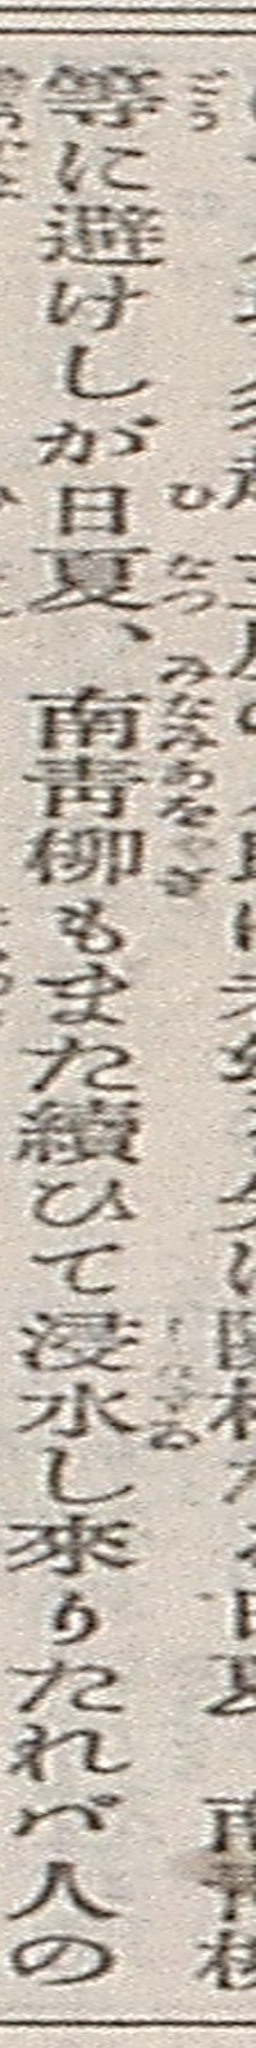等に避けしが日夏、南青柳もまた続ひて浸水し来りたれば人の
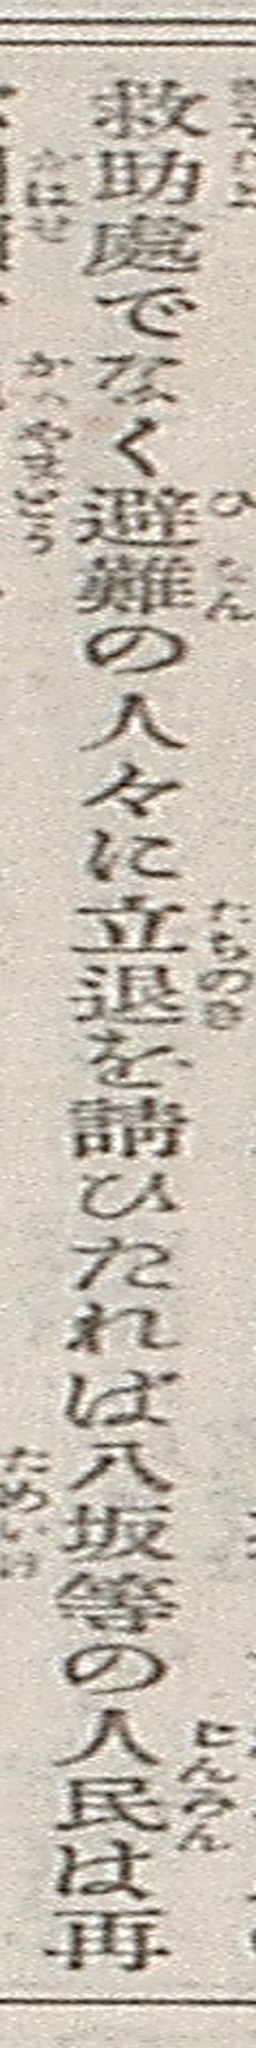救助処でなく避難の人々に立退を請ひたれば八坂等の人民は再
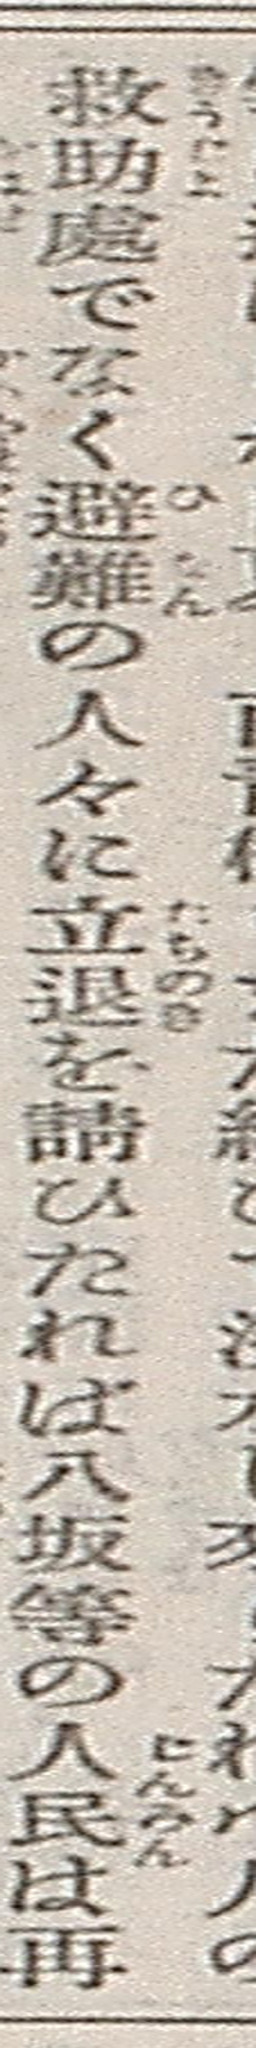救助処でなく避難の人々に立退を請ひたれば八坂等の人民は再
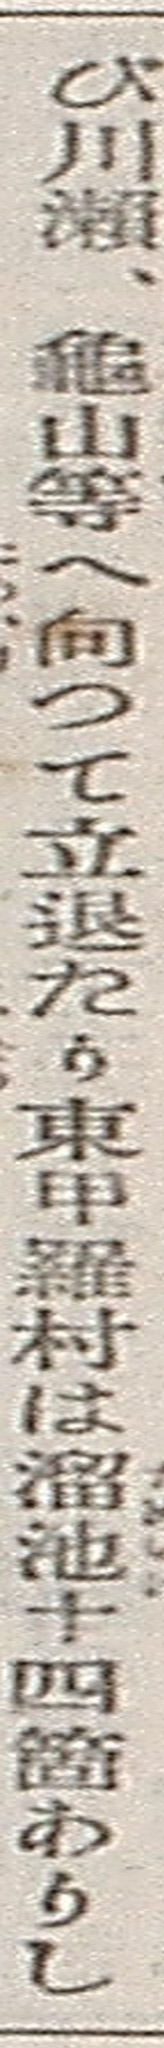び川瀬、亀山等へ向つて立退たり東甲羅村は溜池十四箇ありし
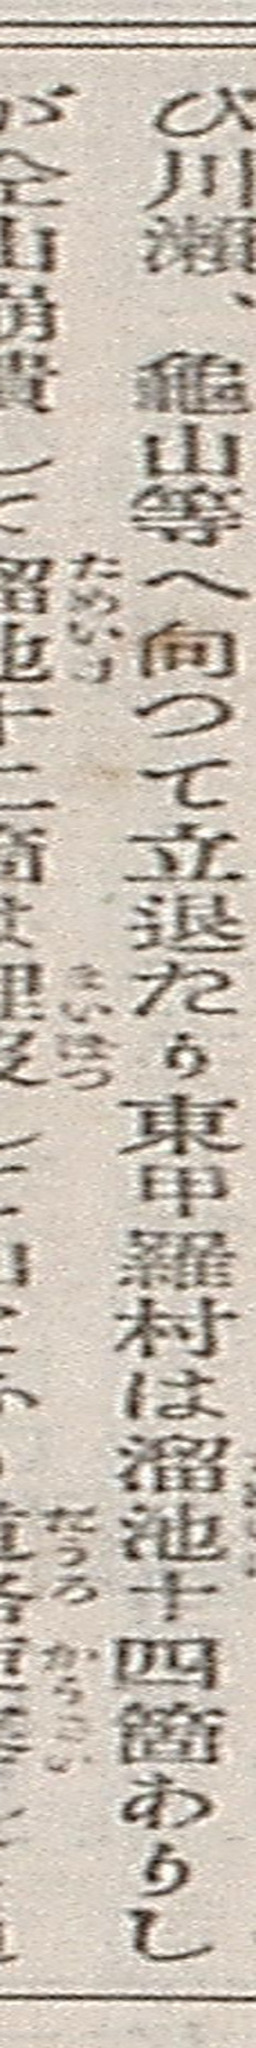が同山崩潰して溜池十二箇は埋没して山となり道路梗塞して通
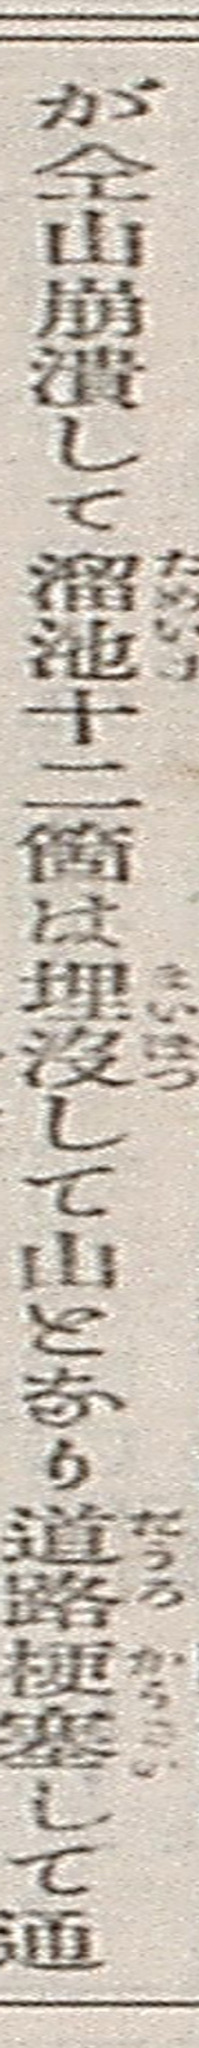が同山崩潰して溜池十二箇は埋没して山となり道路梗塞して通
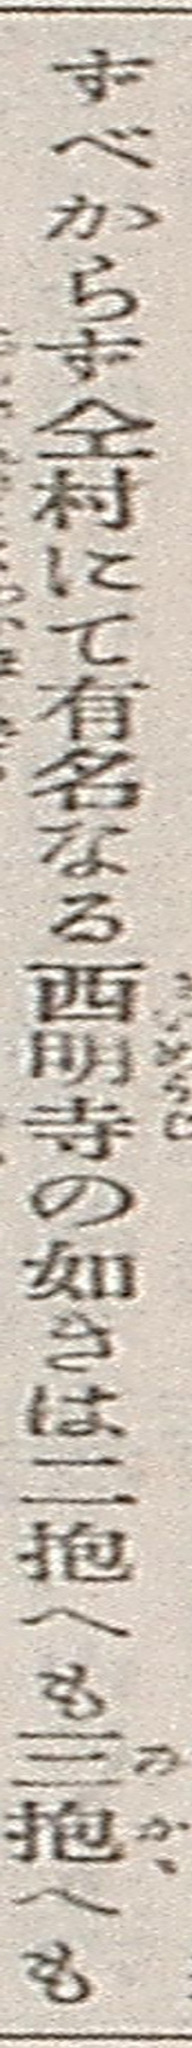ずべからず同村にて有名なる西明寺の如きは二抱へも三抱へも
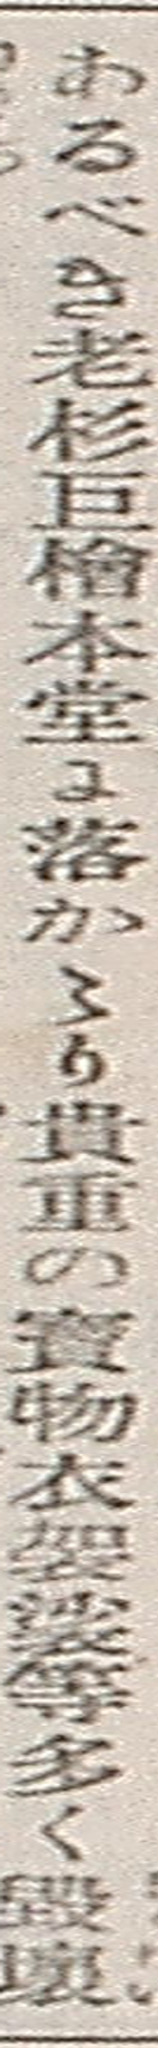あるべき老杉巨檜本堂に落かゝり貴重の宝物衣袈裟等多く毀壊
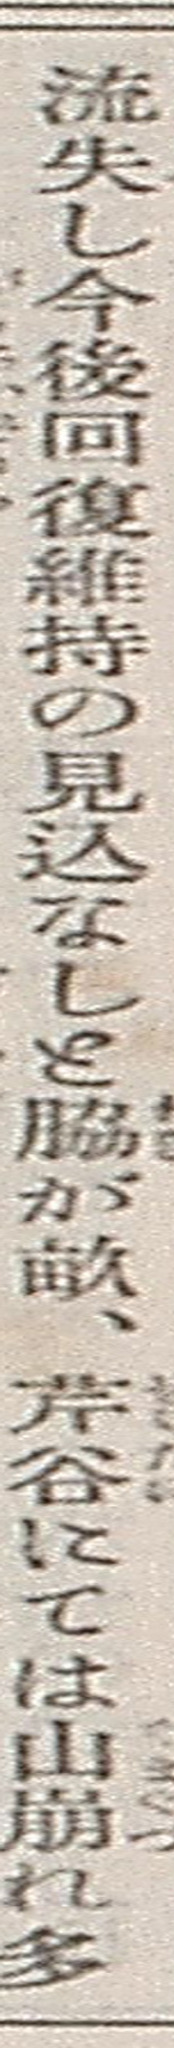流失し今後回復維持の見込なしと脇が畝、芹谷にては山崩れ多
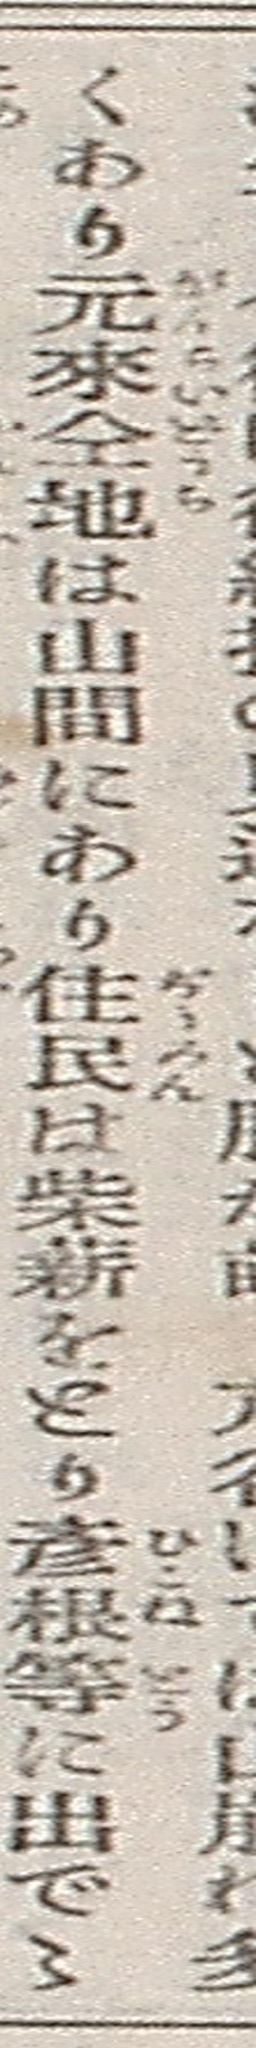くあり元来同地は山間にあり住民は柴薪をとり彦根等に出でゝ
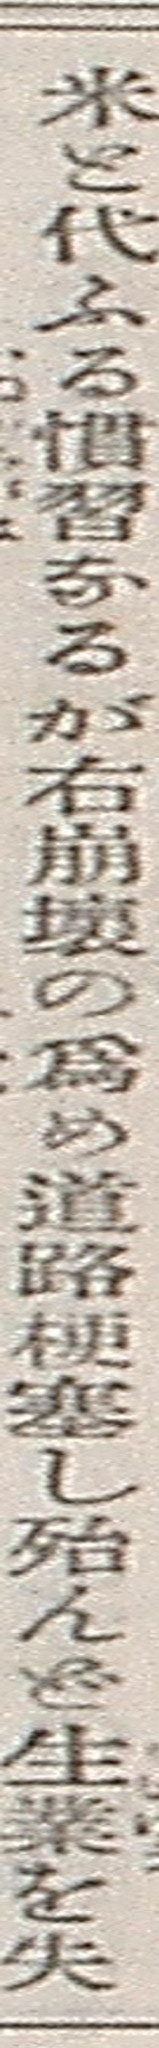米と代ふる慣習なるが右崩壊の為め道路梗塞し殆んど生業を失
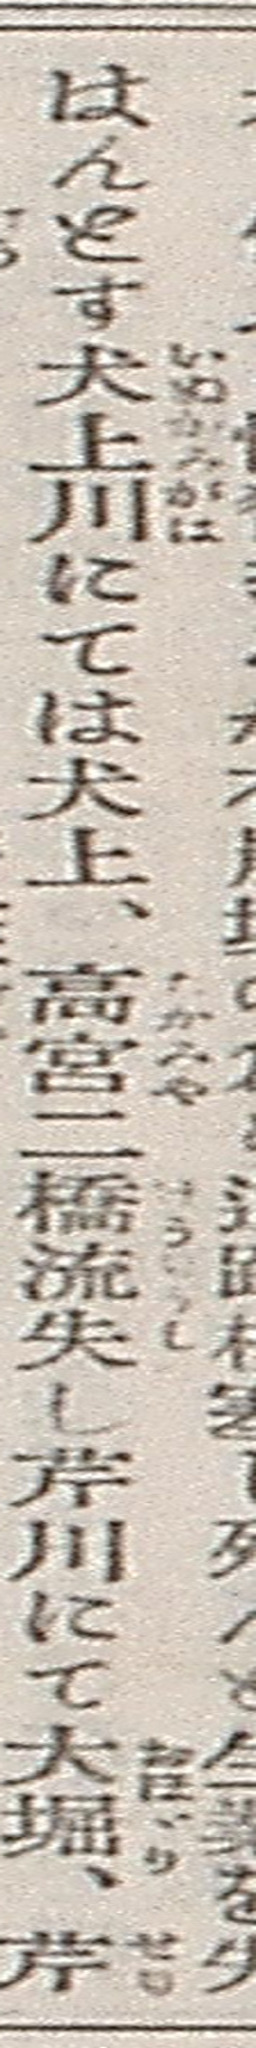はんとす犬上川にては犬上、高宮二橋流失し芹川にて大堀、芹
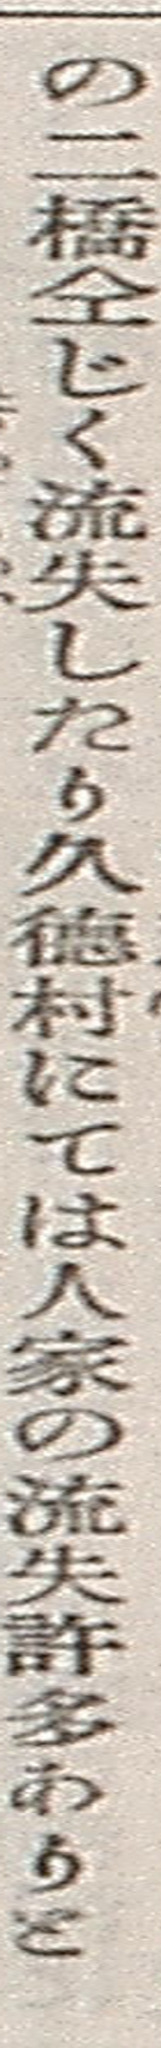の二橋同じく流失したり久徳村にては人家の流失許多ありと
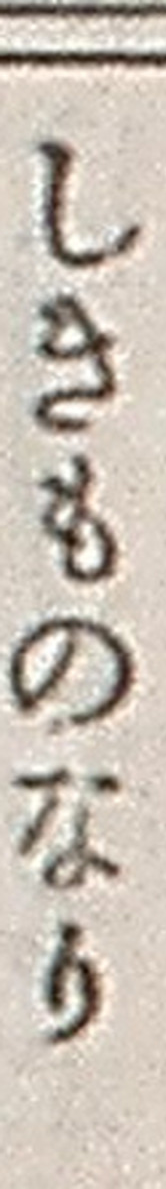しきものなり
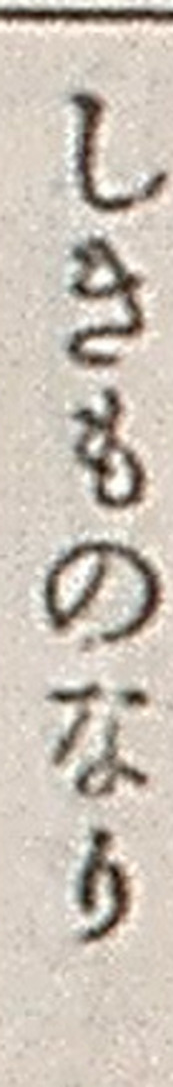しきものなり
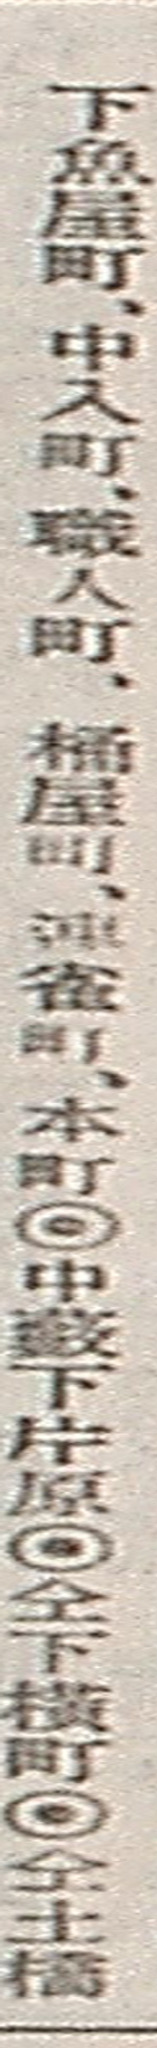下魚屋町、中入町、職人町、桶屋町、連雀町、本町⦿中藪下片原⦿同下横町⦿同土橋
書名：風俗畫報臨時増刊第百二十八號　洪水被害録（下）
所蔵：東京大学地震研究所図書室 Earthquake Research Institute Library, The University of Tokyo, JAPAN
